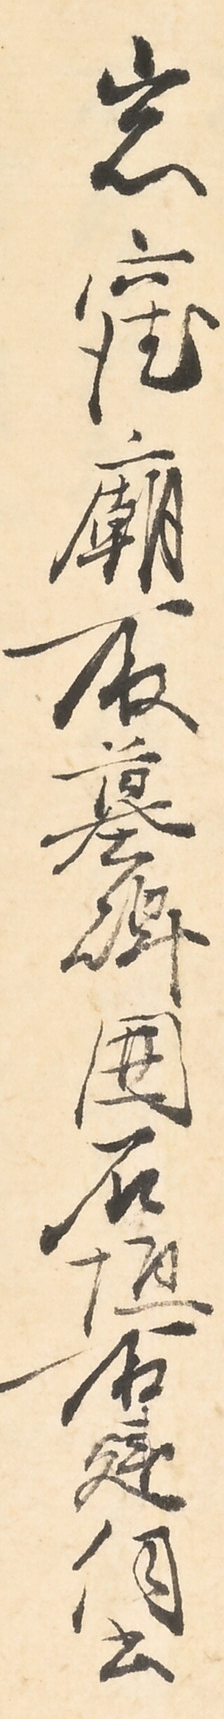岩窪廟取墓碑囲石垣取建伺書

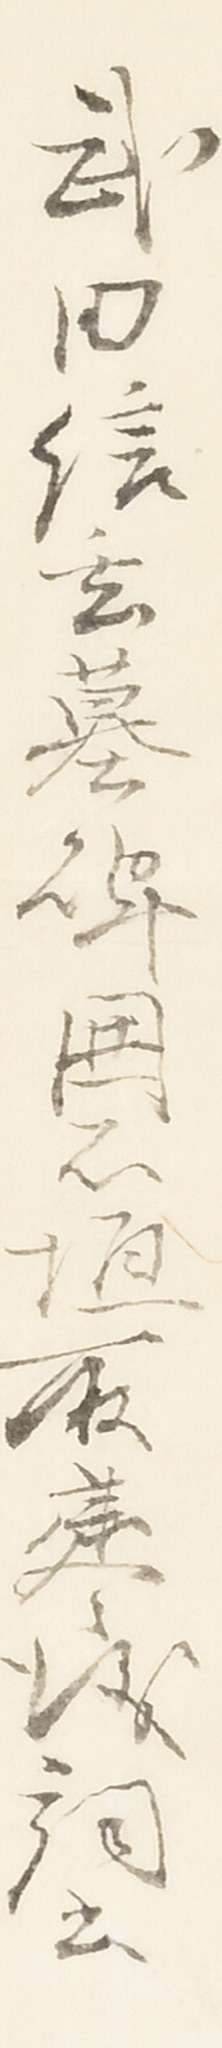武田信玄墓碑囲石垣取建之儀詞書
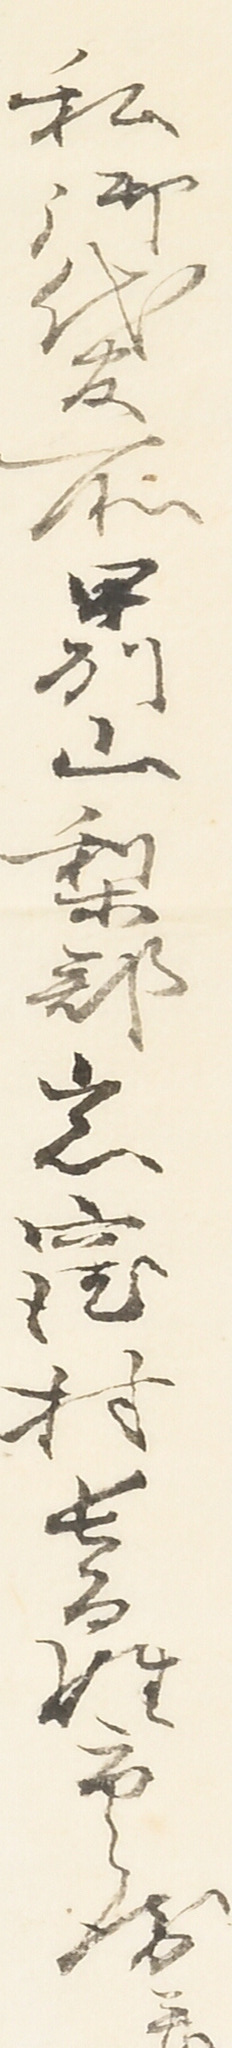私御代官所甲州山梨郡岩窪村長百姓市兵衛幷
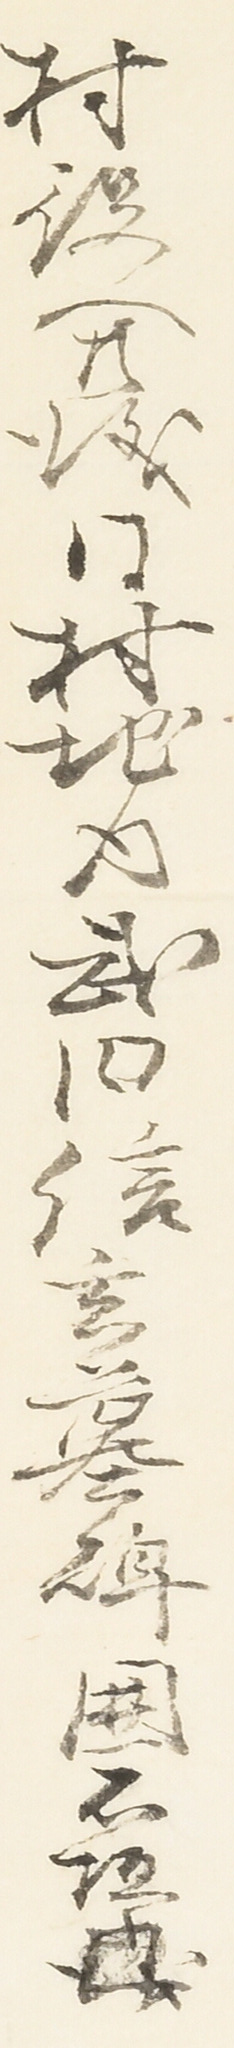村役人共儀同村地内武田信玄墓碑囲石垣
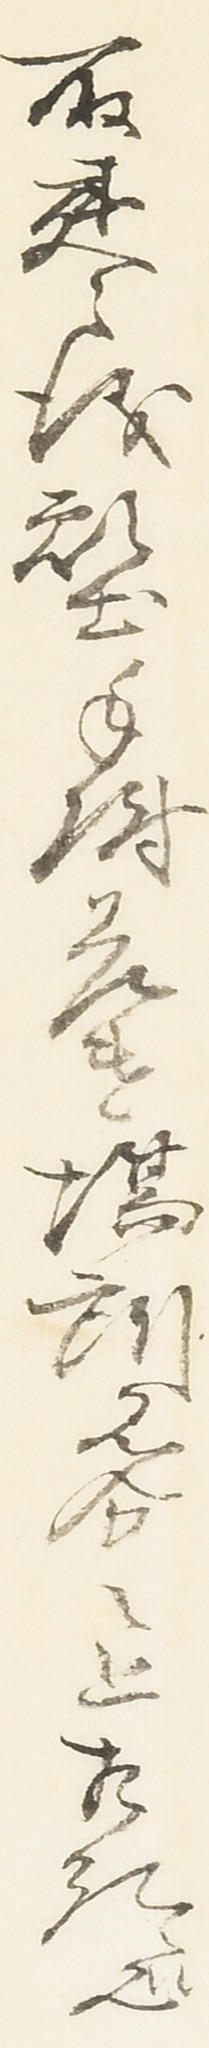取建之儀願出手附差遣場所見分之上相糺候処
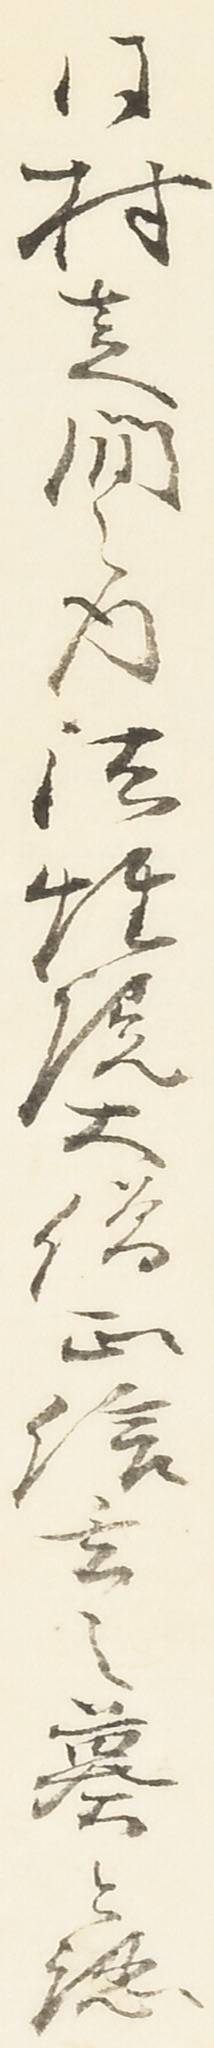同村芝間之内法性院大僧正信玄之墓と認
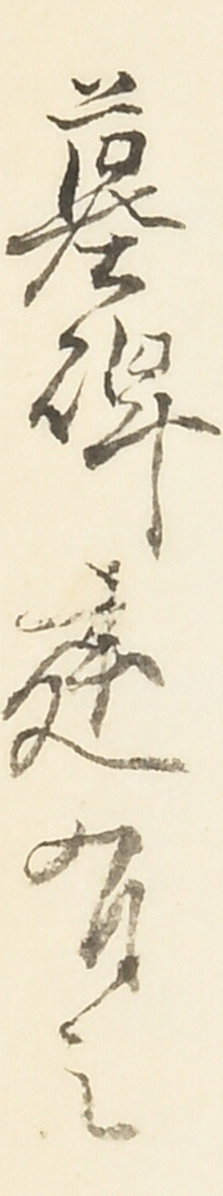墓碑建有之
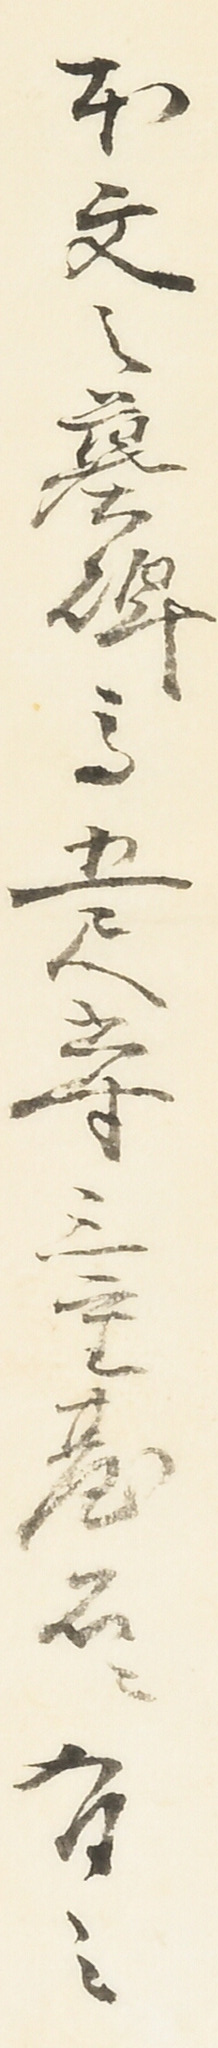本文乃墓碑高五尺六寸三重台石ニ有之

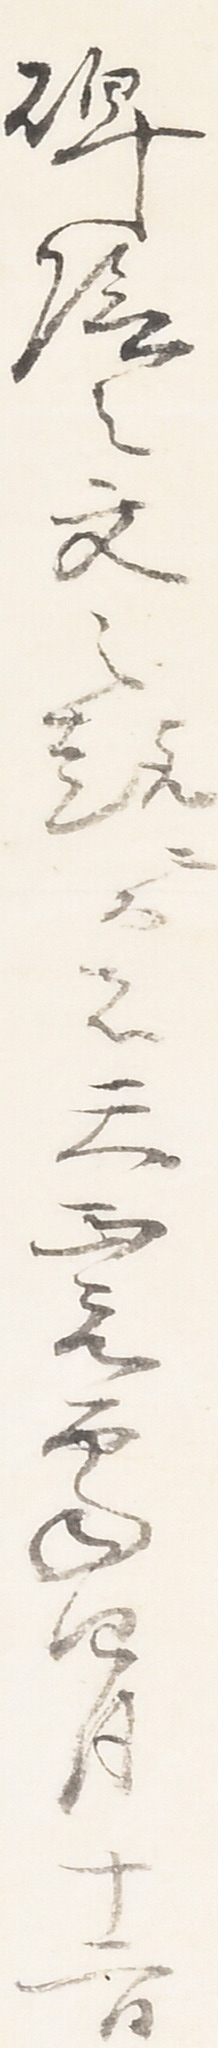碑陰乃文之趣ニ而は天正元酉年四月十二日
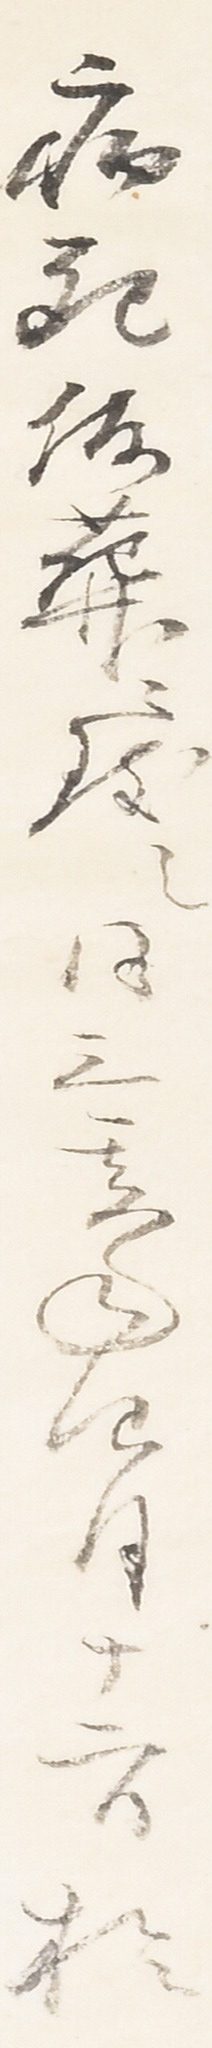病死仮葬ニ致し同三亥年四月十二日於
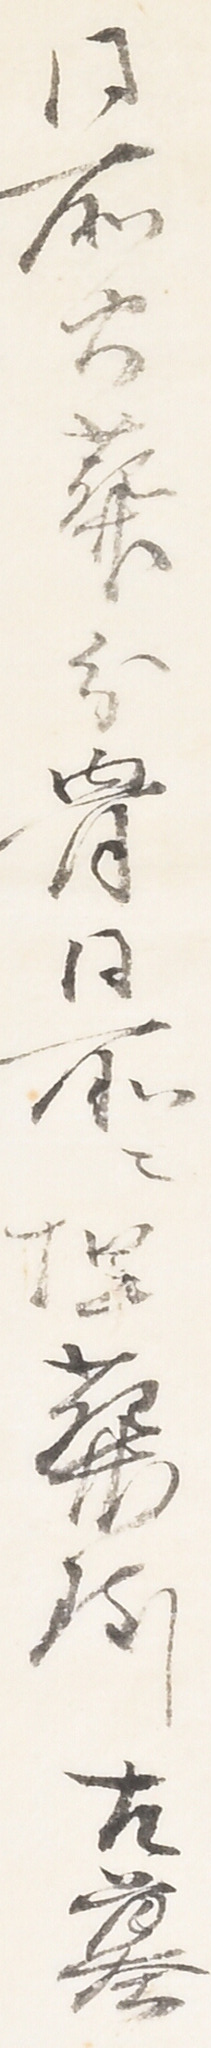同所火葬分骨同所ニ埋葬致し古墓
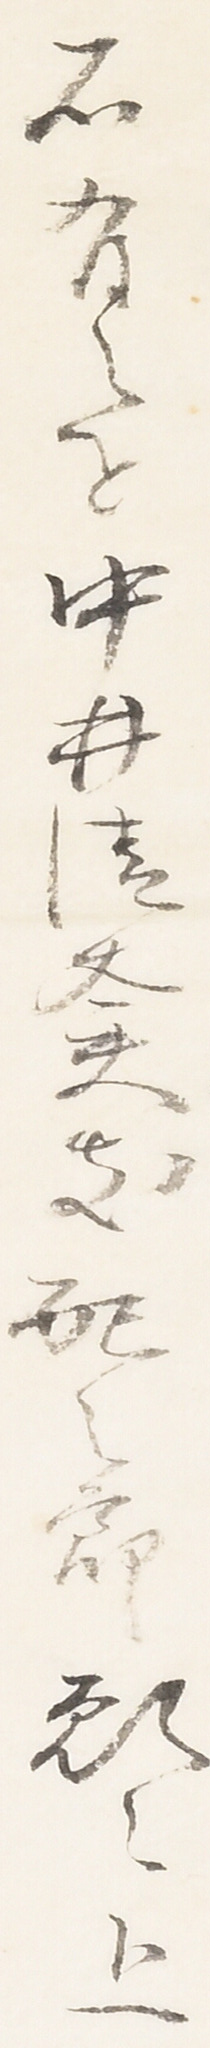石有之を中井清太夫支配之節願之上
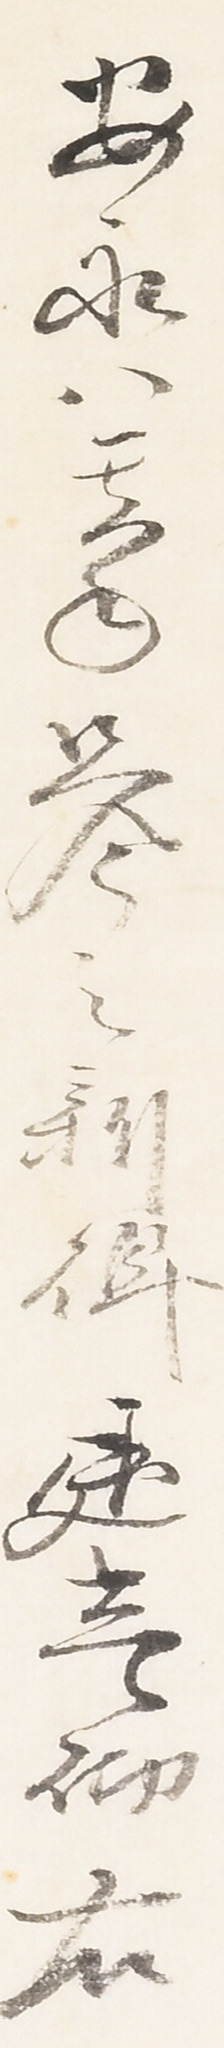安永八亥年只今之新碑建立之砌右
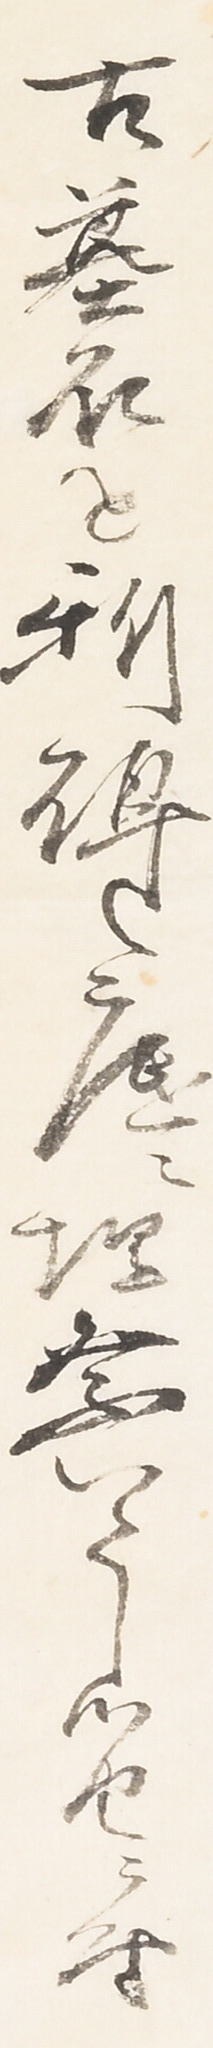古墓石を新碑之底ニ埋祭いたし候由ニ付
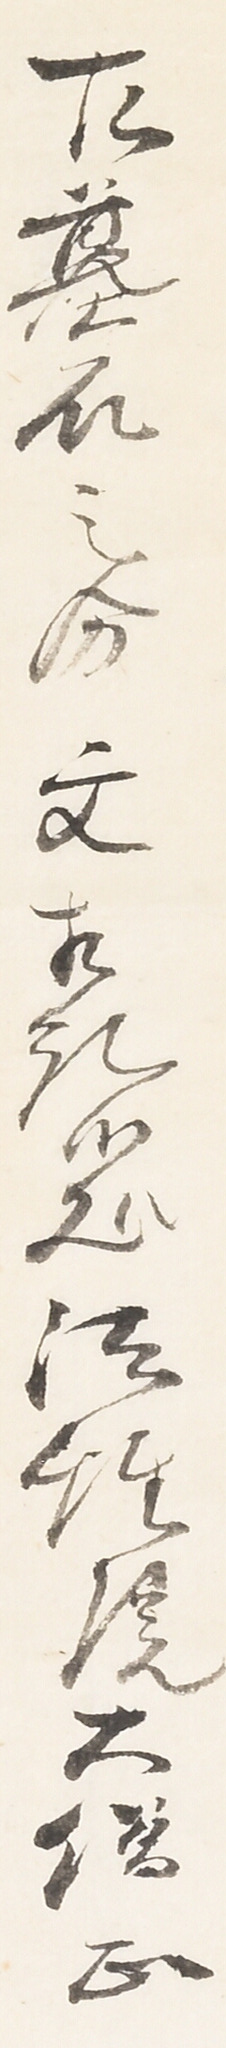古墓石之分文相糺候処法性院大僧正
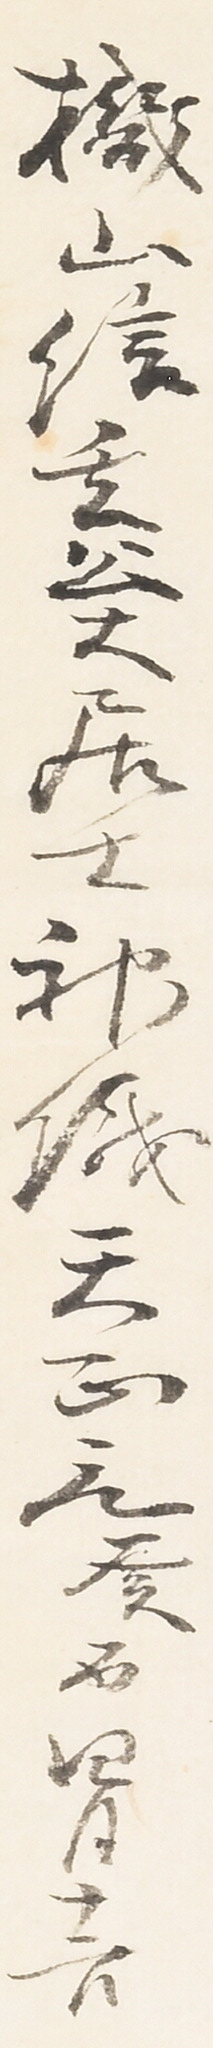機山信玄公大居士神儀天正元癸酉四月十二日
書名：岩窪廟取（所）墓碑囲石垣取建伺書
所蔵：伊那市立高遠町図書館・合同会社AMANE
